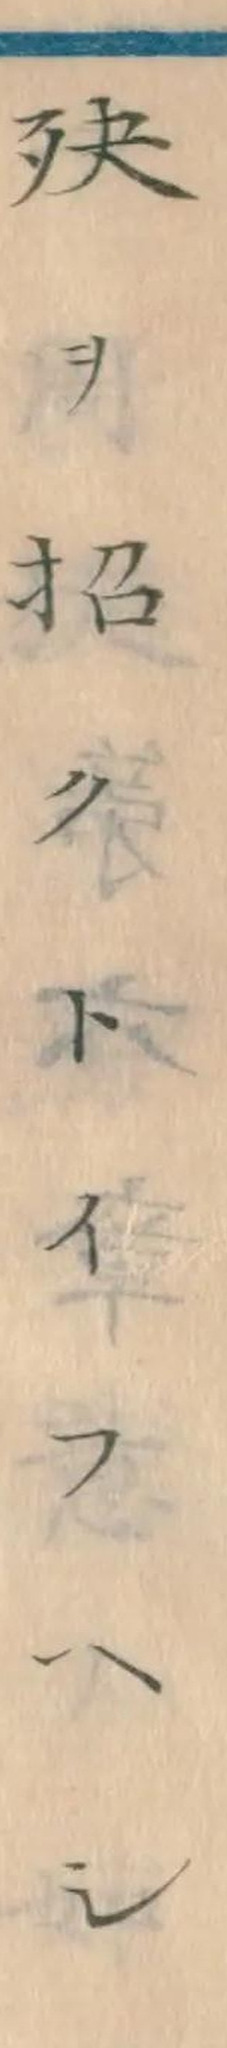殃ヲ招クトイフヘシ
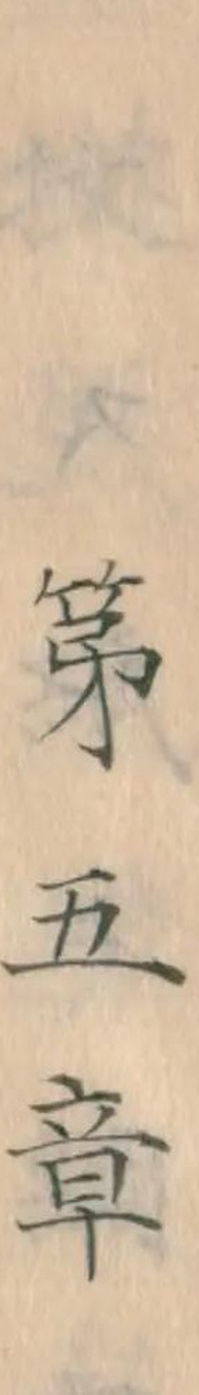第五章
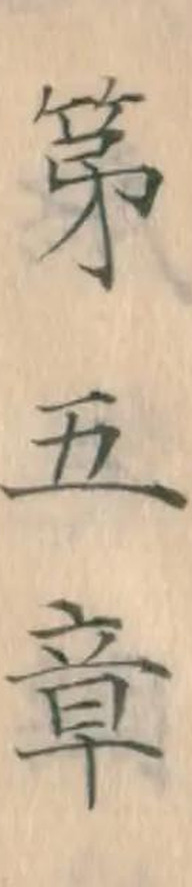第五章
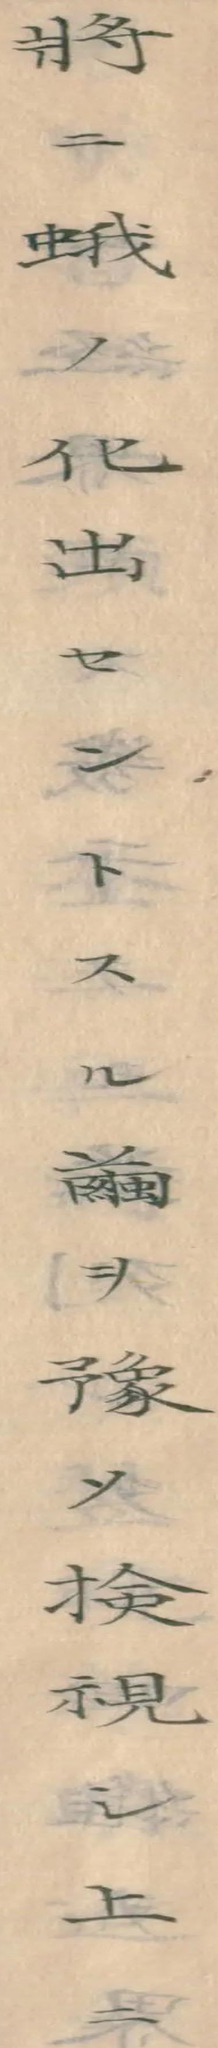将ニ蛾ノ化出セントスル繭ヲ予メ検視シ上ニ
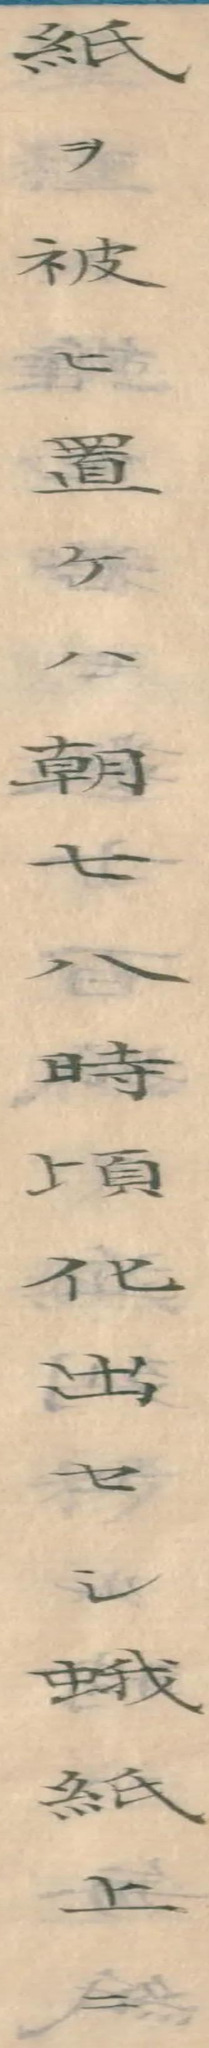紙ヲ被ヒ置ケハ朝七八時頃化出セシ蛾紙上ニ
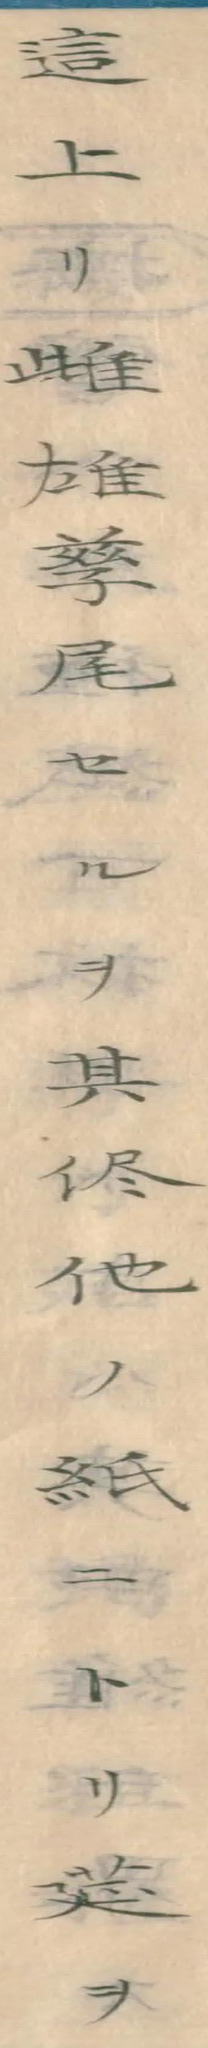這上リ雌雄孳尾セルヲ其侭他ノ紙ニトリ莚ヲ
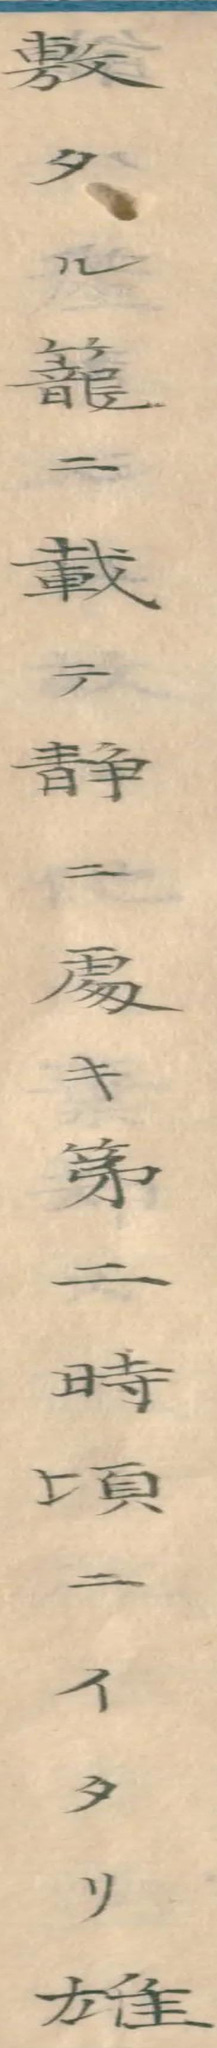敷タル籠ニ載テ静ニ処キ第二時頃ニイタリ雄
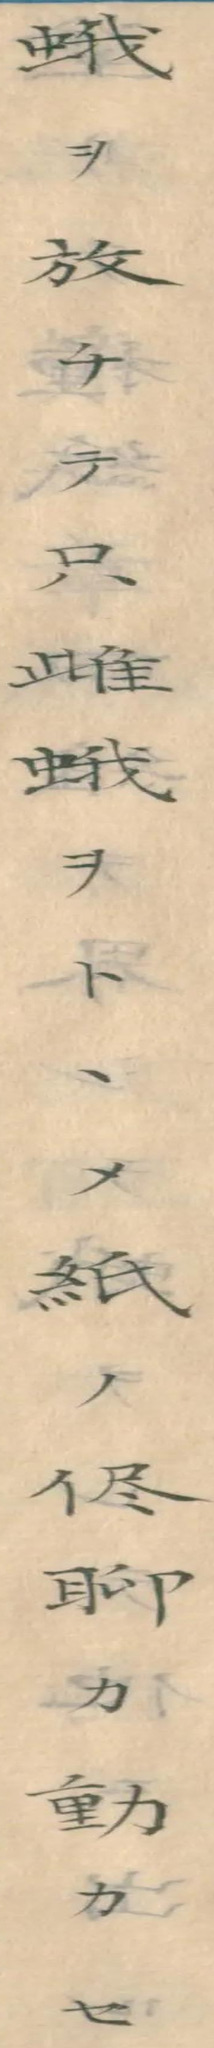蛾ヲ放チテ只雌蛾ヲトヽメ紙ノ侭聊カ動カセ

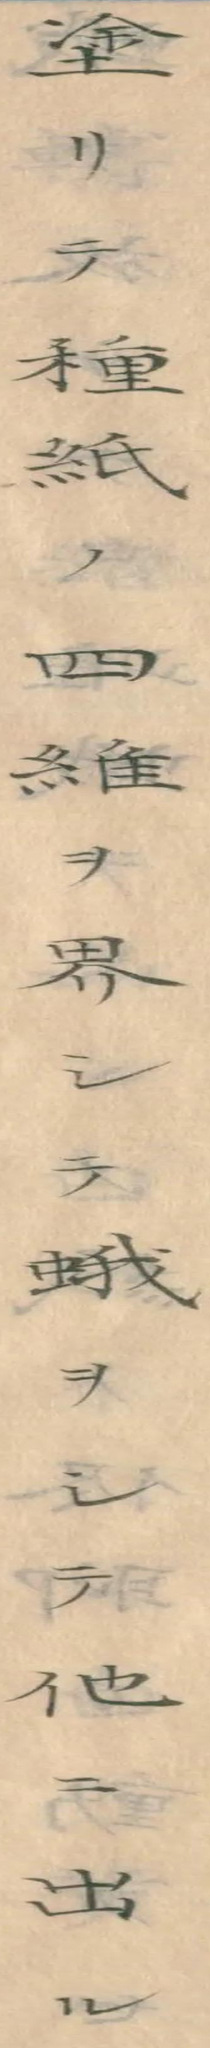塗リテ種紙ノ四維ヲ界シテ蛾ヲシテ他ニ出ル
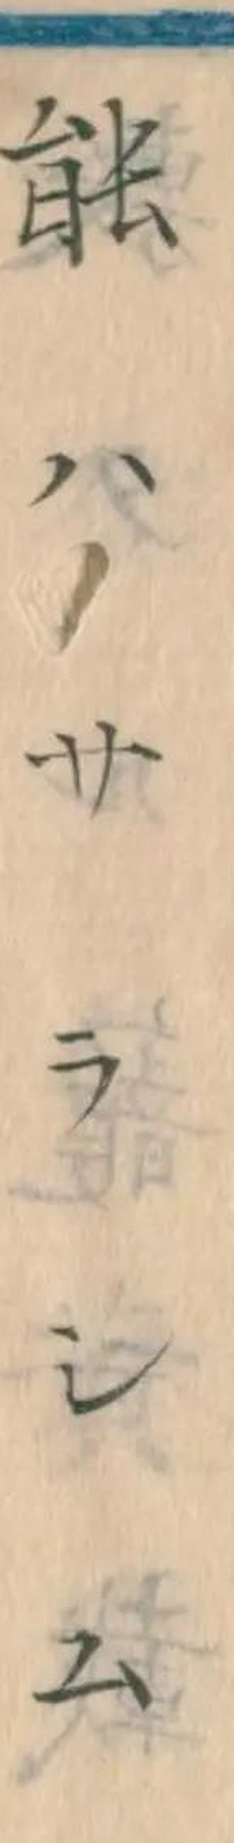能ハサラシム
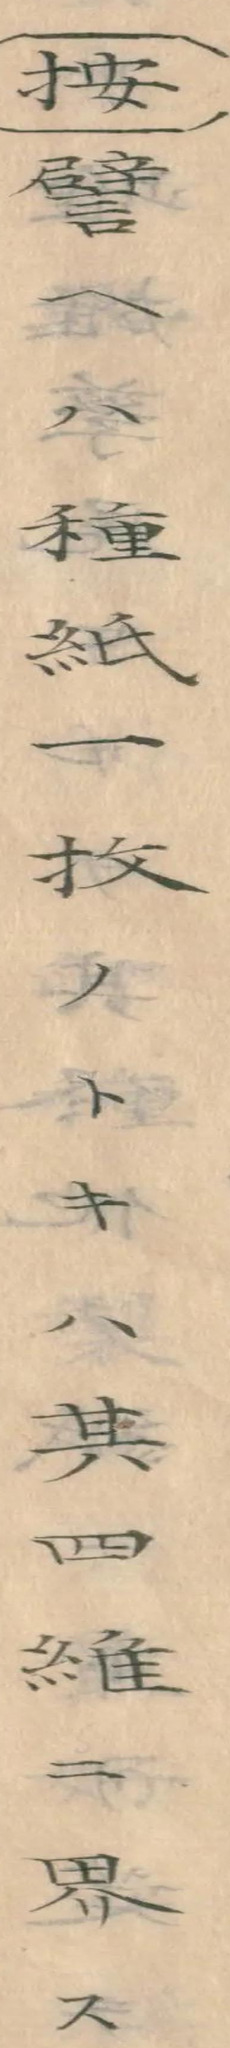[按]譬ヘハ種紙一枚ノトキハ其四維ニ界ス
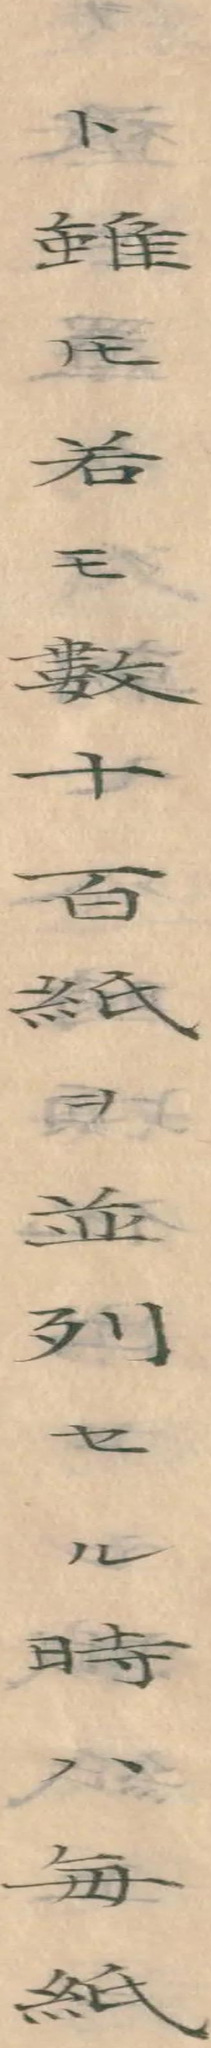ト雖トモ若モ数十百紙ヲ並列セル時ハ毎紙
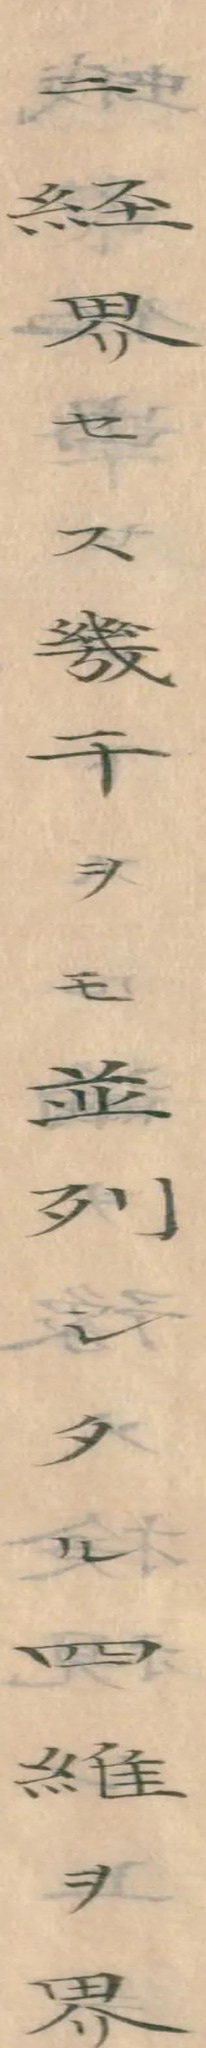ニ経界セス幾千ヲモ並列シタル四維ヲ界
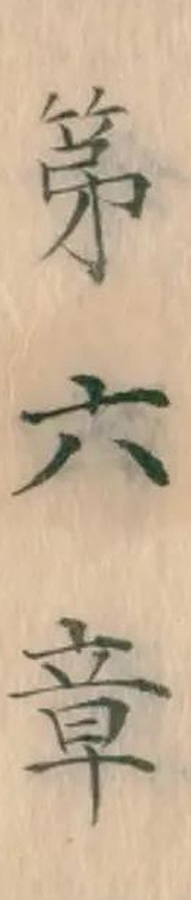第六章
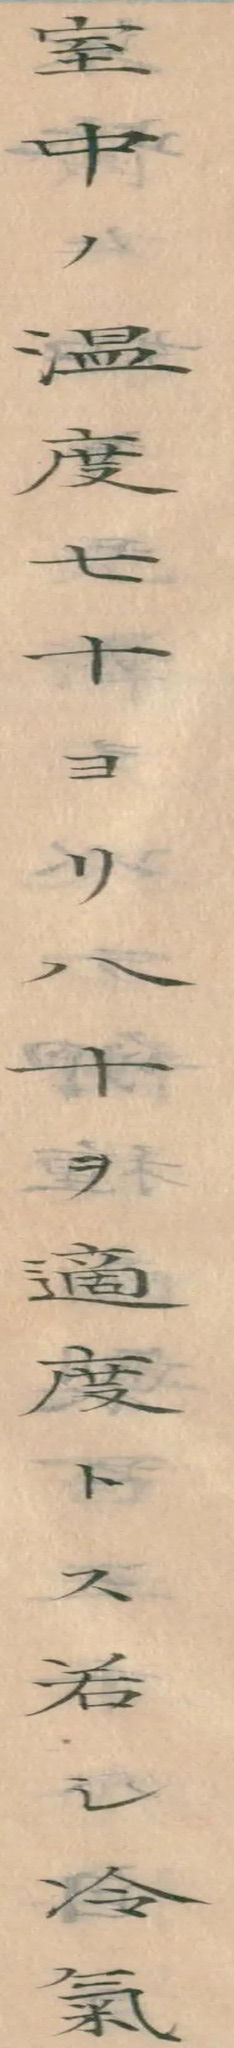室中ノ温度七十ヨリ八十ヲ適度トス若シ冷気
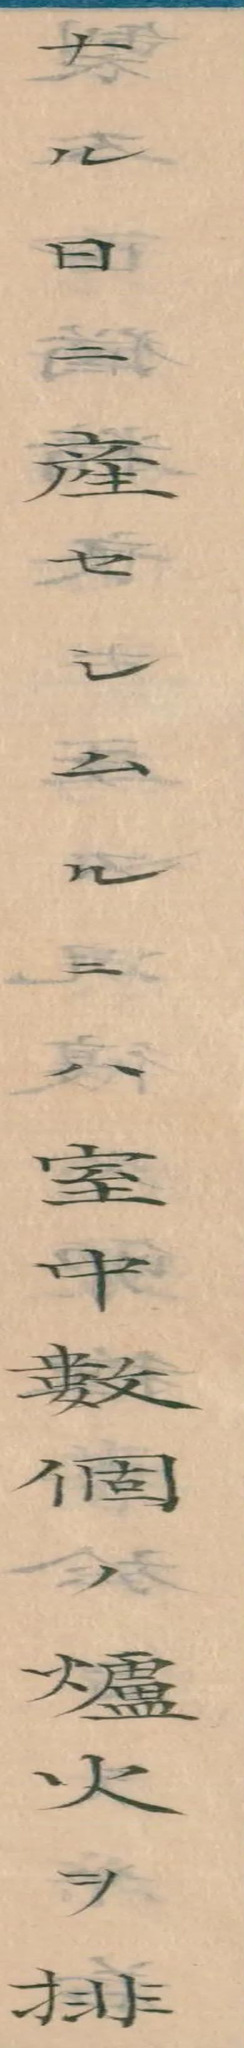ナル日ニ産セシムルニハ室中数個ノ炉火ヲ排
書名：蚕桑集成
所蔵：国立国会図書館 National Diet Library, JAPAN
